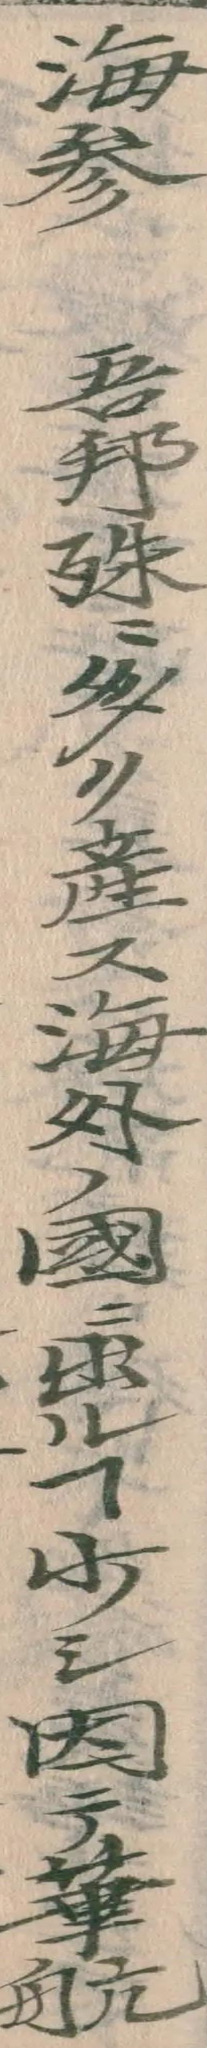海参吾邦殊ニ多ク産ス海外ノ国ニ出ルコト少シ因テ華航
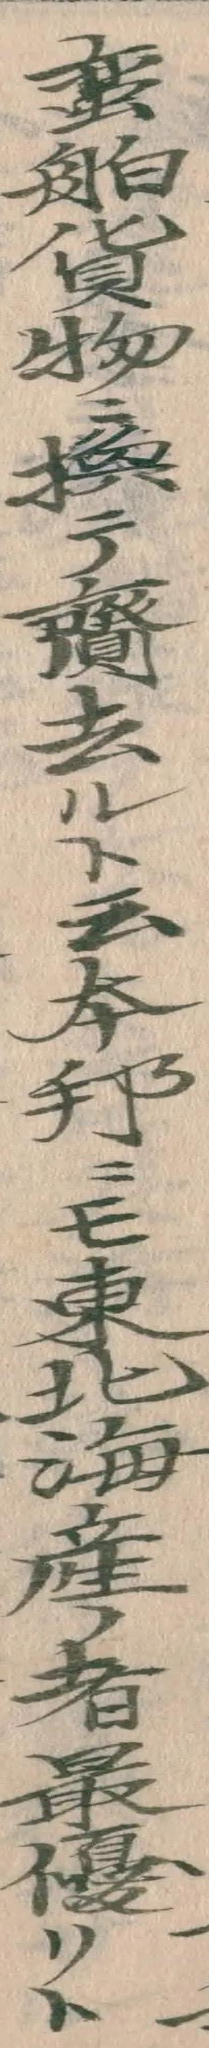蛮舶貨物ニ換テ齎去ルト云本邦ニモ東北海産ノ者最優リト
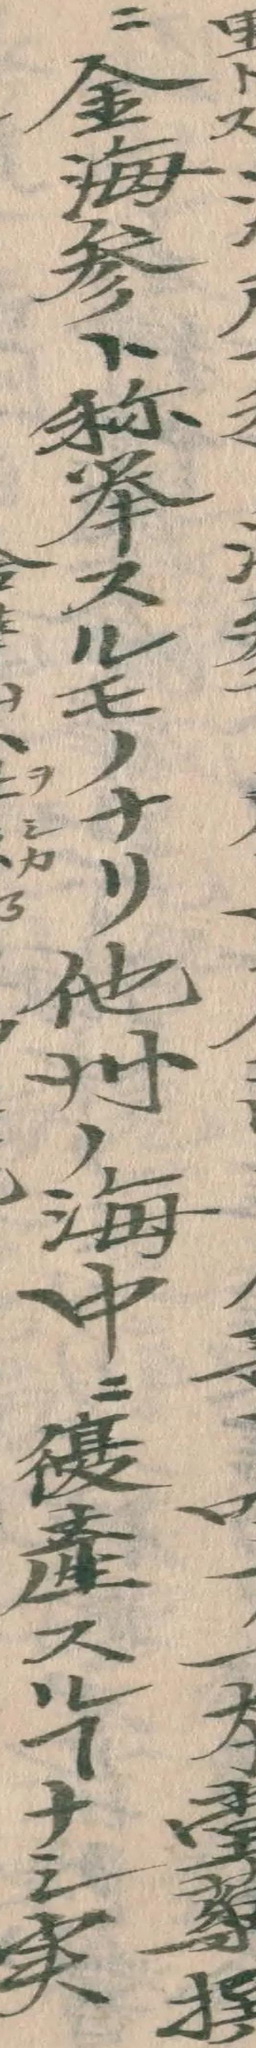ニ金海参ト称挙スルモノナリ他州ノ海中ニ復産スルコトナシ実
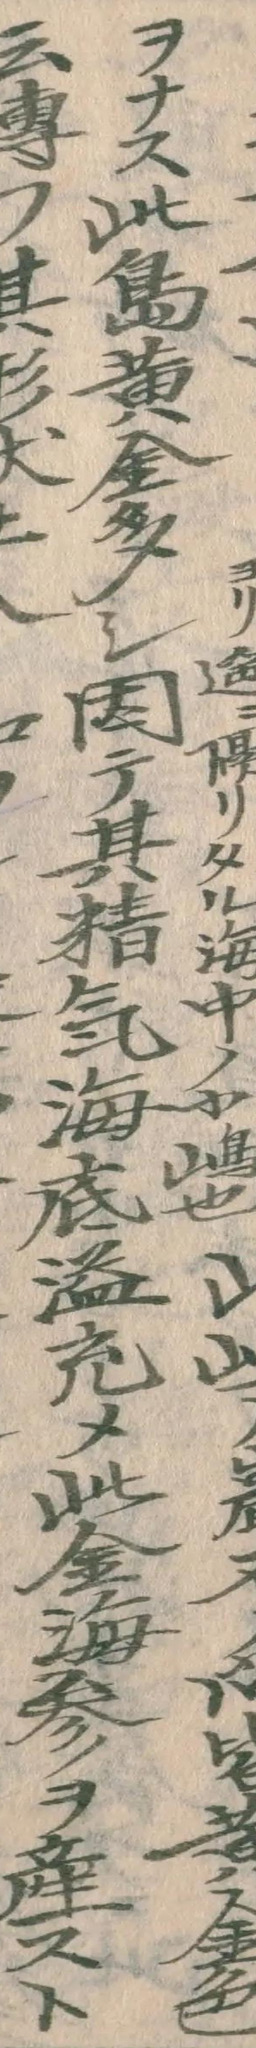ヲナス此島黄金多シ因テ其精気海底溢充シテ此金海参ヲ産スト
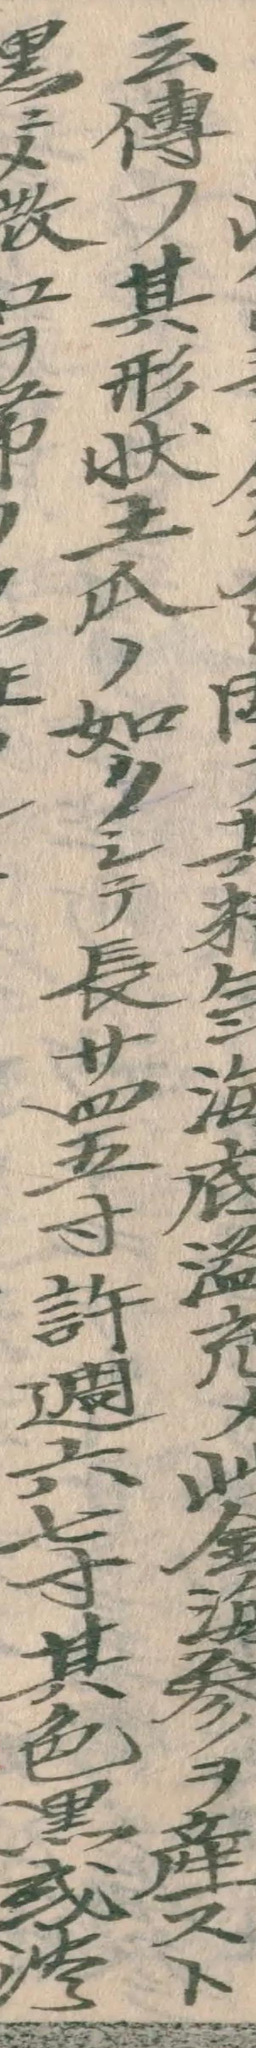云伝フ其形状土瓜ノ如クシテ長サ四五寸許週六七寸其色黒或淡
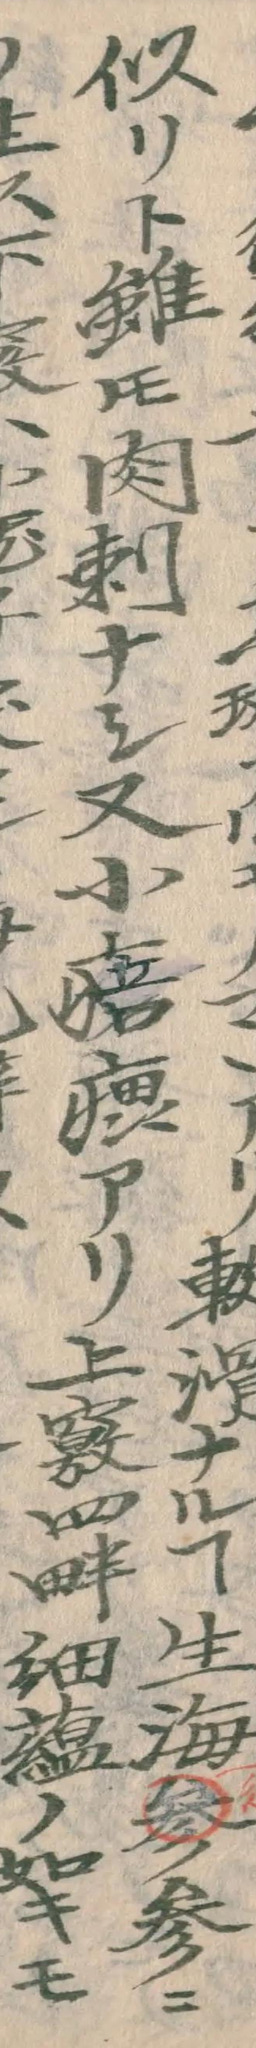似リト雖トモ肉刺ナシ又小㾦㿔アリ上竅四畔細藴ノ如キ
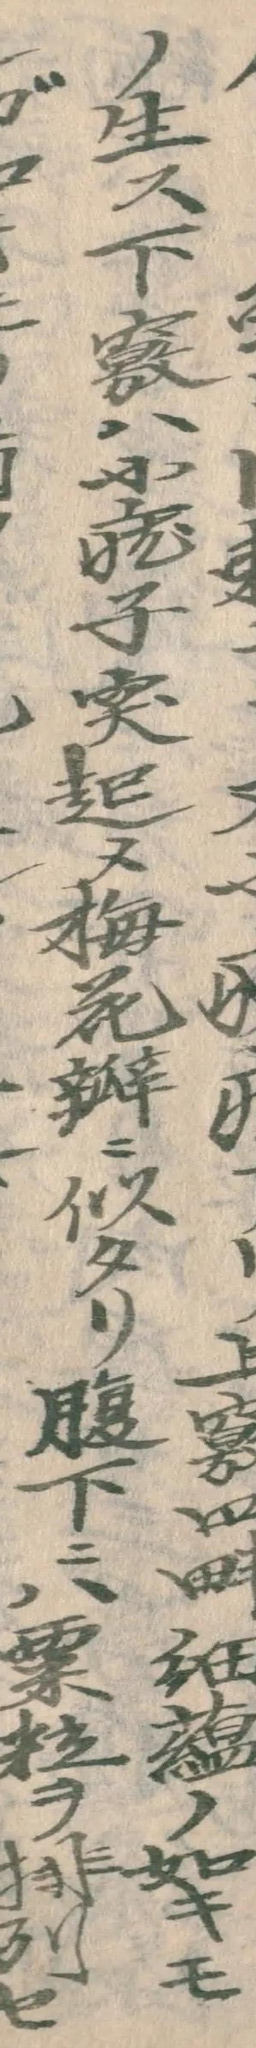ノ生ス下竅ハ小疣子突起シテ梅花瓣ニ似タリ腹下ニハ粟粒ヲ排列セ
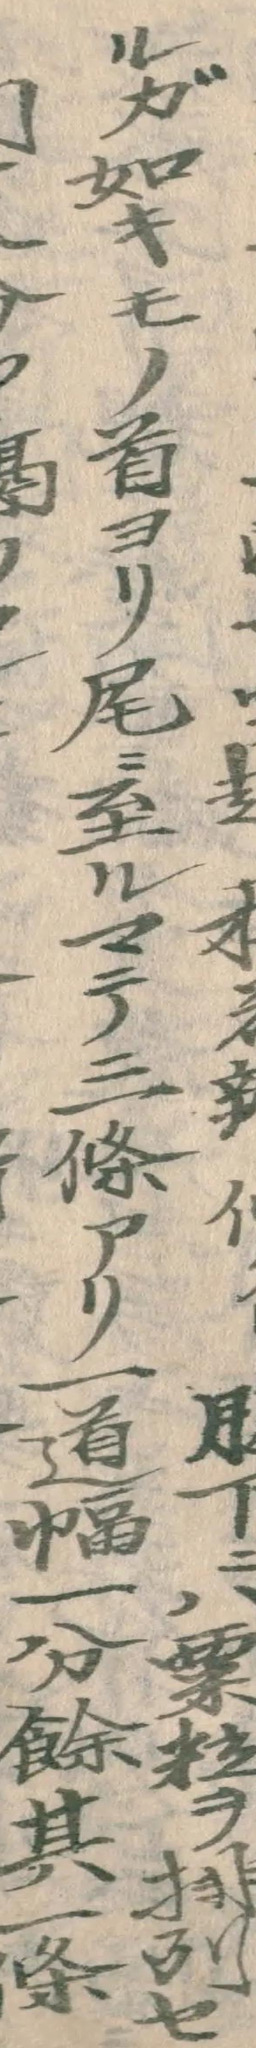ルガ如キモノ首ヨリ尾ニ至ルマテ三條アリ一道幅一分餘其一條
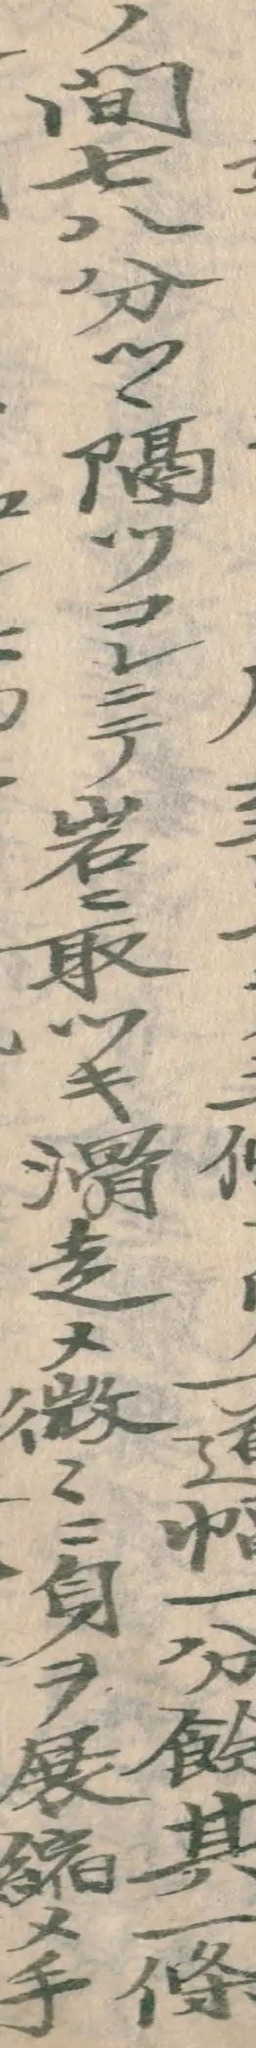ノ間七八分ツヽ隔ツコレニテ岩ニ取ツキ滑走シテ微々ニ身ヲ展縮シテ手
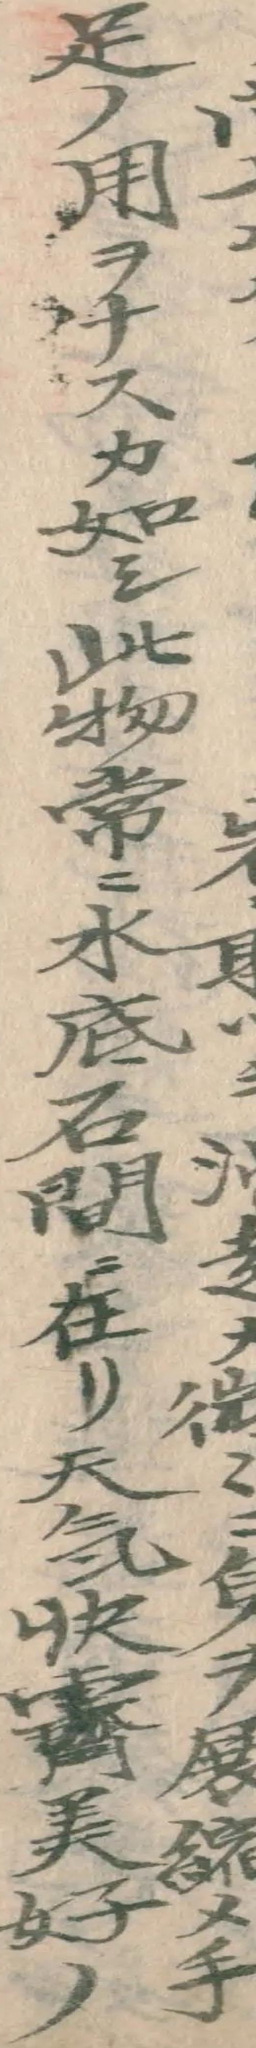足ノ用ヲナスカ如シ此物常ニ水底石間ニ在リ天気快霽美好ノ

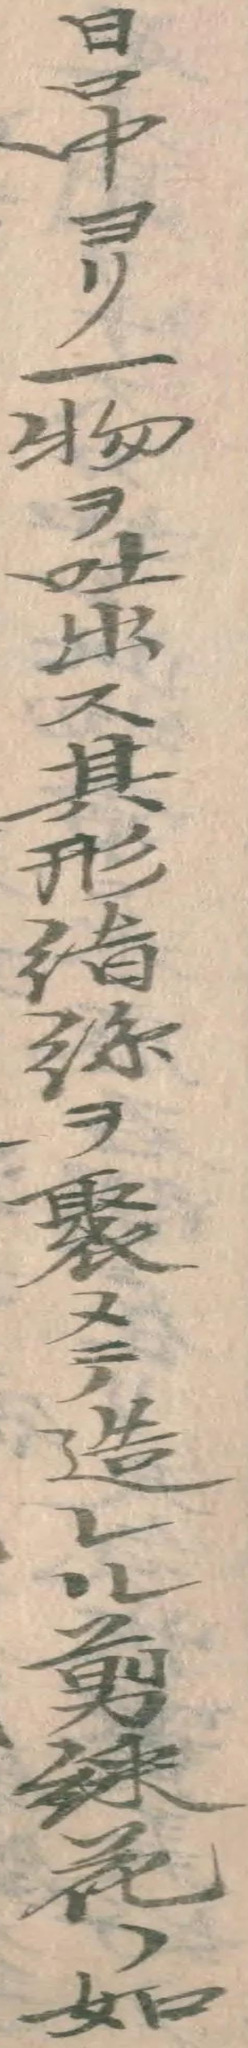日口中ヨリ一物ヲ吐出ス其形𥿻糸を聚メテ造レル剪綵花ノ如
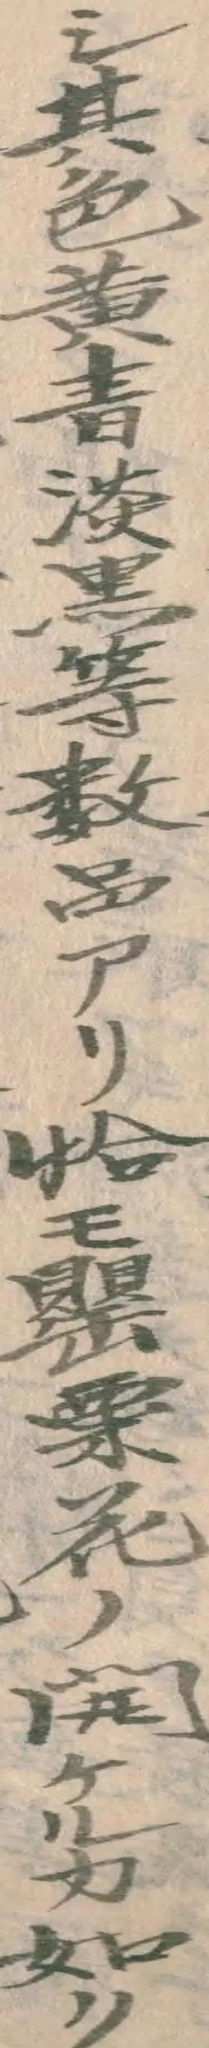シ其色黄青淡黒等数品アリ恰モ罌粟花ノ開ケルカ如ク
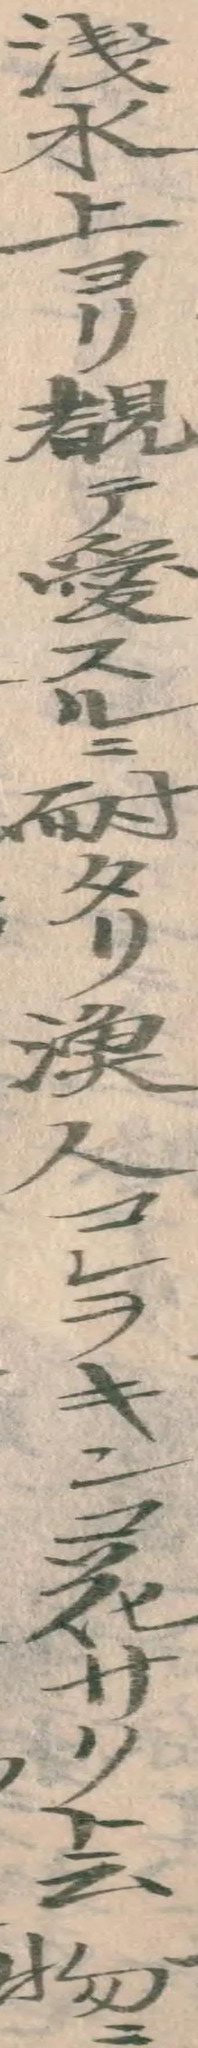浅水上ヨリ覩テ愛スルニ耐タリ漁人コレヲキンコ花サクト云物ニ
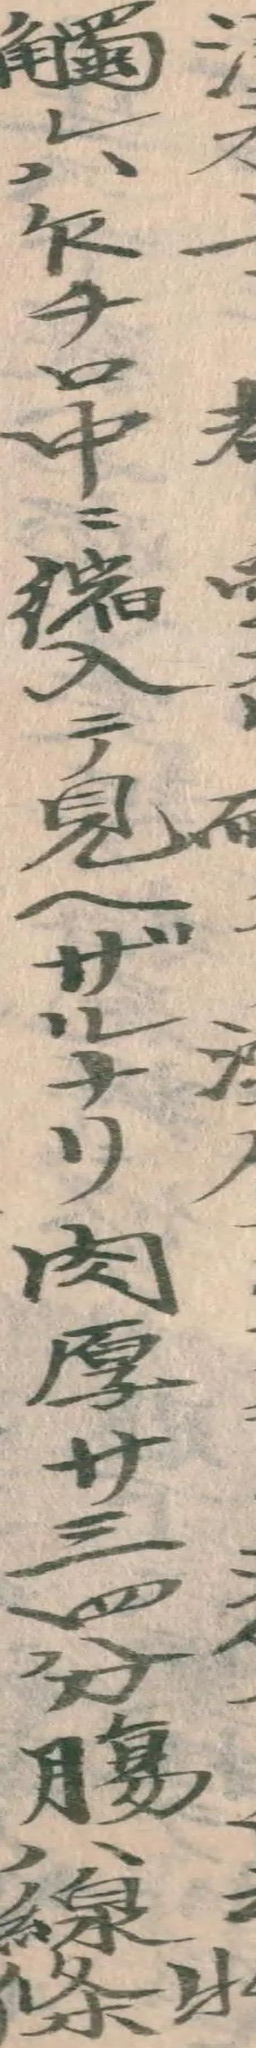触レハ乍チ口中ニ縮入テ見ヘザルナリ肉厚サ三四分腸ハ線條
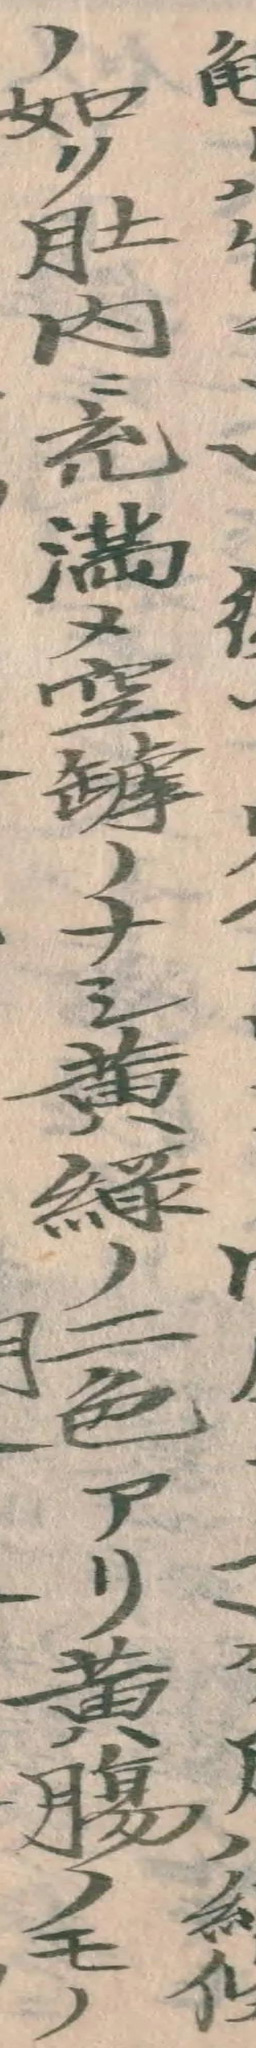ノ如ク肚内ニ充満シテ空罅ノナシ黄緑ノ二色アリ黄腸ノモノ
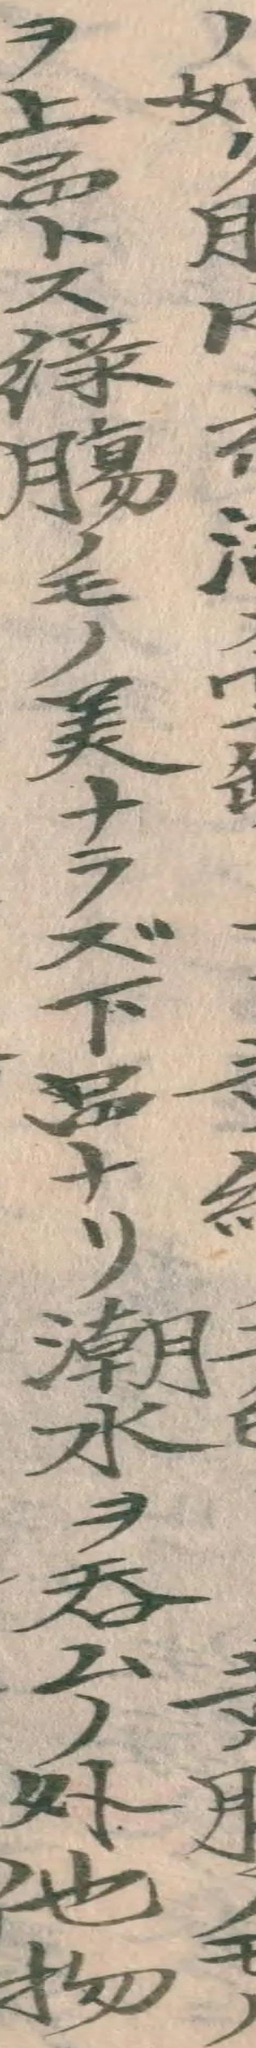ヲ上品トス緑腸ノモノ美ナラズ下品ナリ潮水ヲ呑ムノ外他物
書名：千蟲譜 3巻. [3]
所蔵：国立国会図書館 National Diet Library, JAPAN
